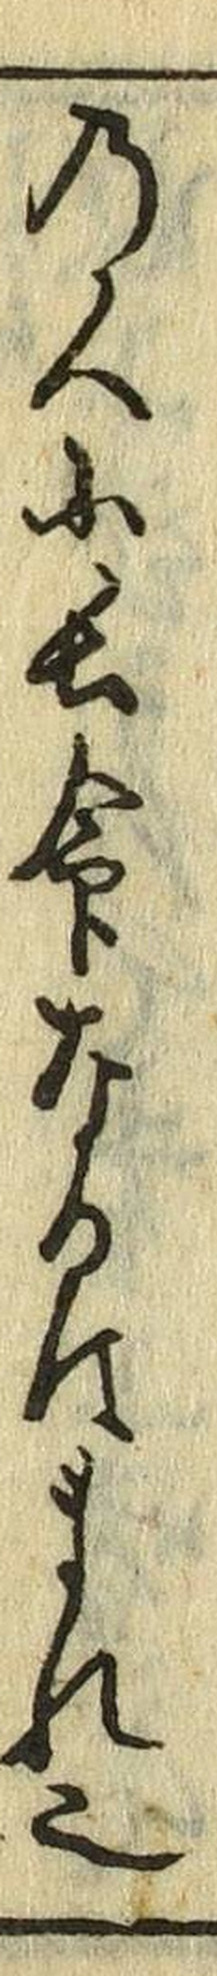の人に長命なるはまれ也
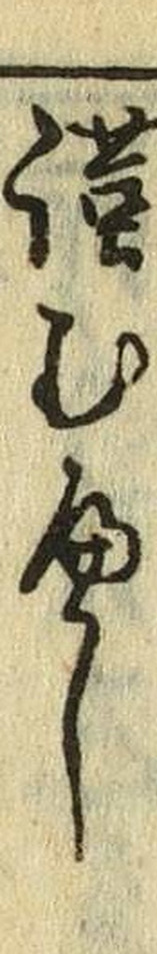謹むへし
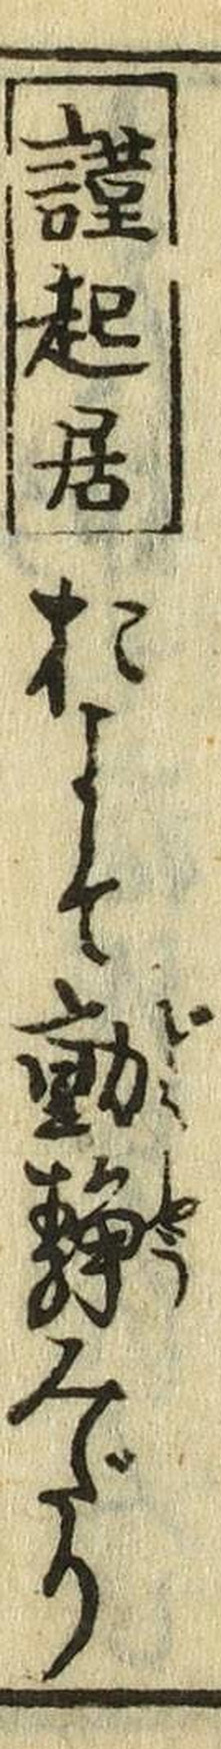謹起居およそ動静みだり
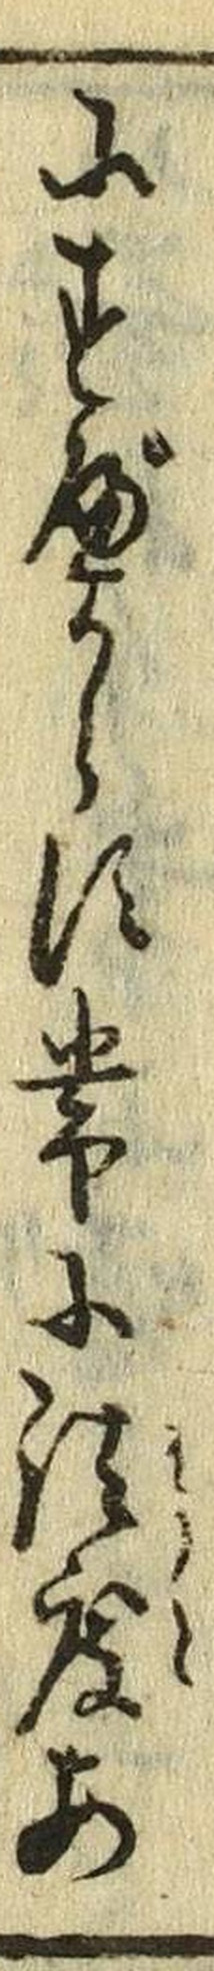にすべからす常に法度あ
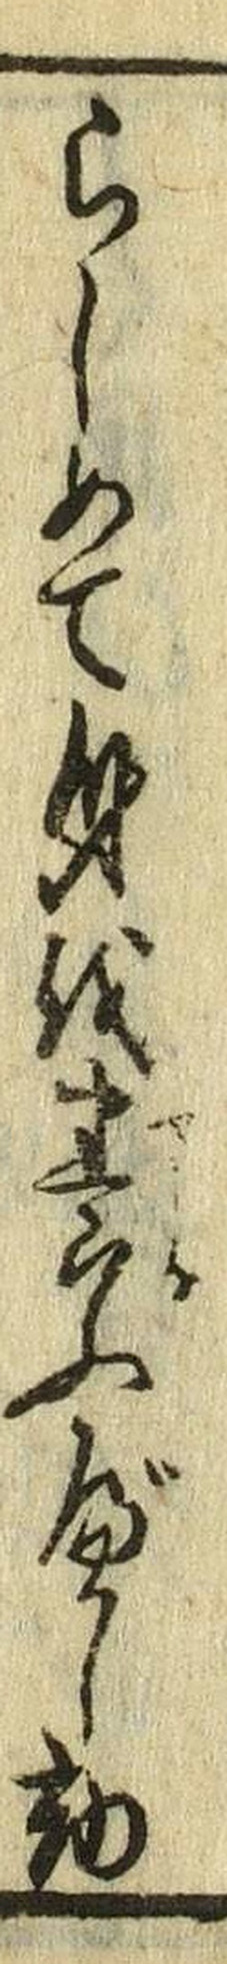らしめて身を養ふべし動
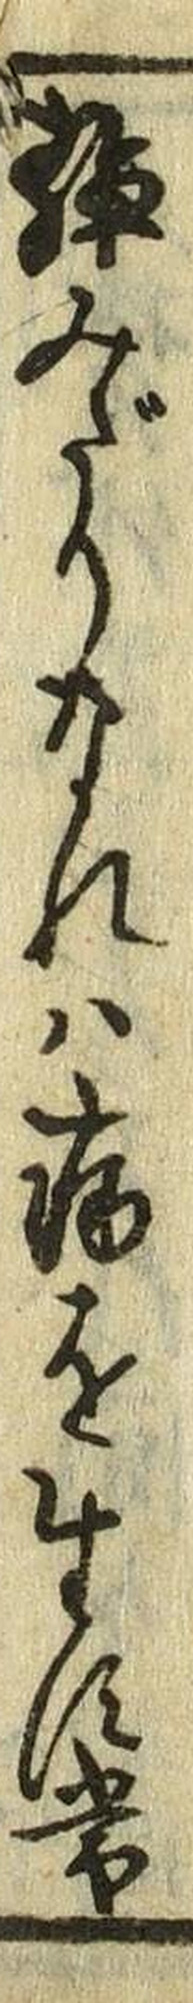静みだりなれは病を生す常
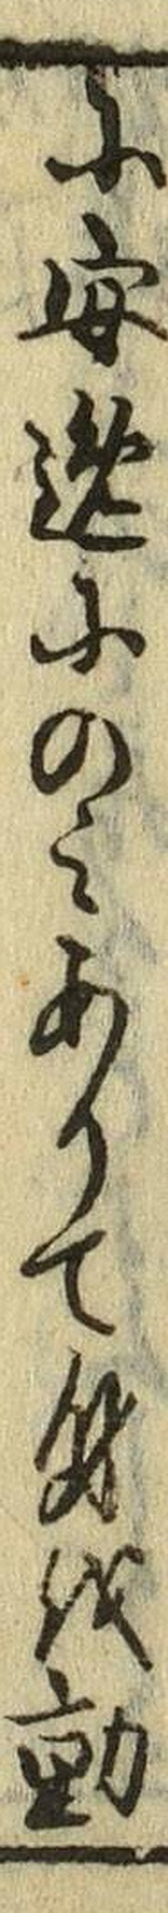に安逸にのみありて身を動
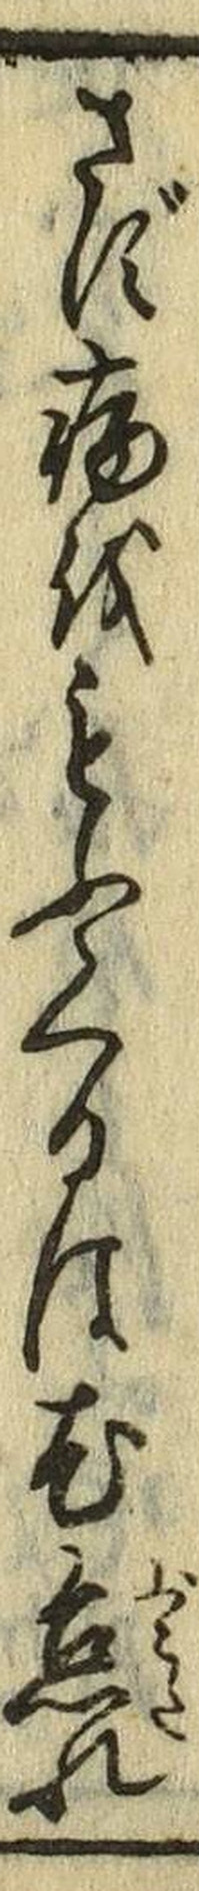さず病をもふくるは尤怠れ
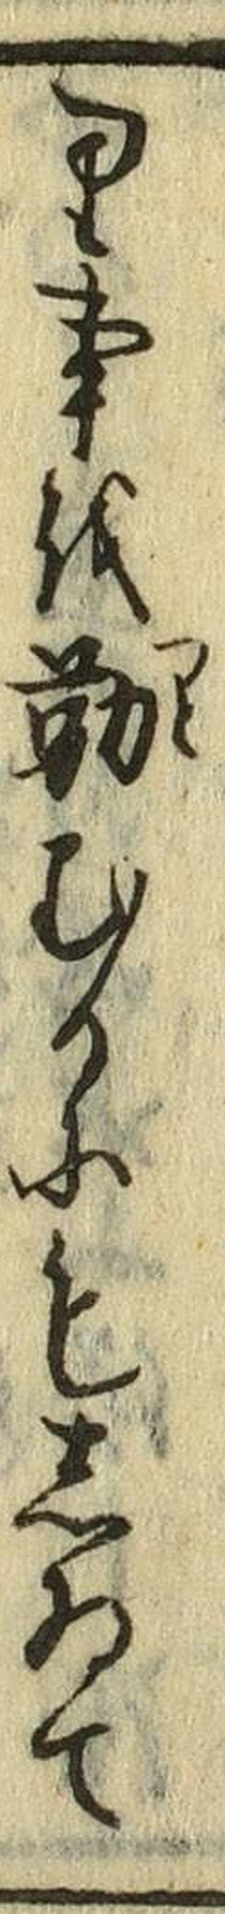り事を勤むるにもしゐて
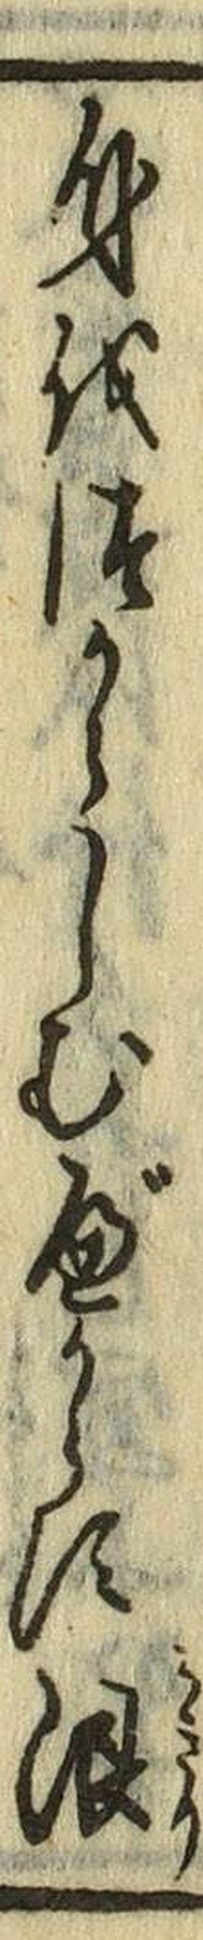身をつからしむべからす限
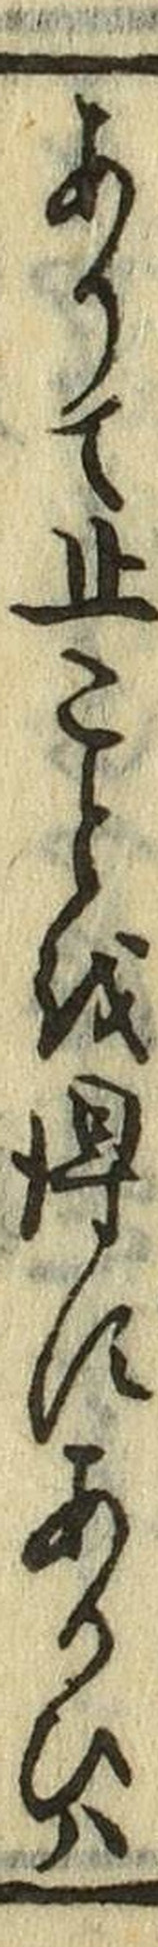ありて止ことを得ずあるひは
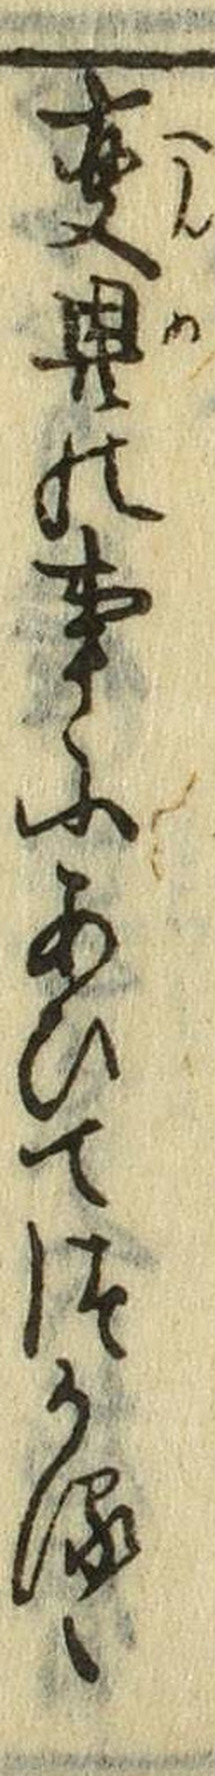変異の事にあひてつかるゝ
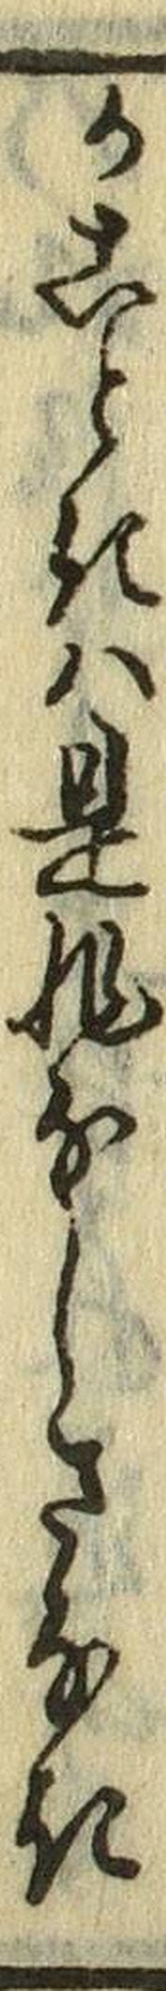がこときは是非なしさなき
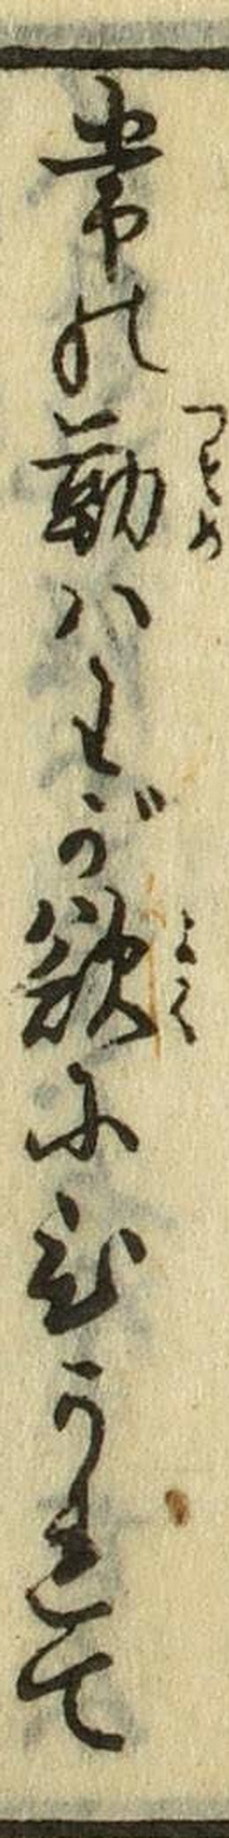常の勤はわが欲にひかれて
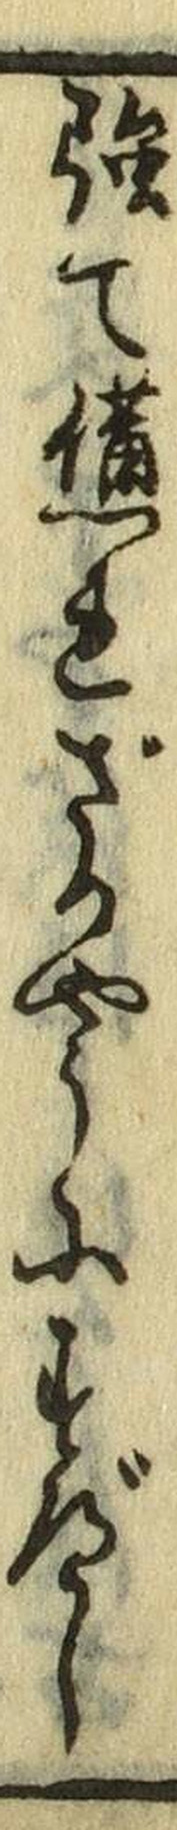強て憊れざるやうにすべし
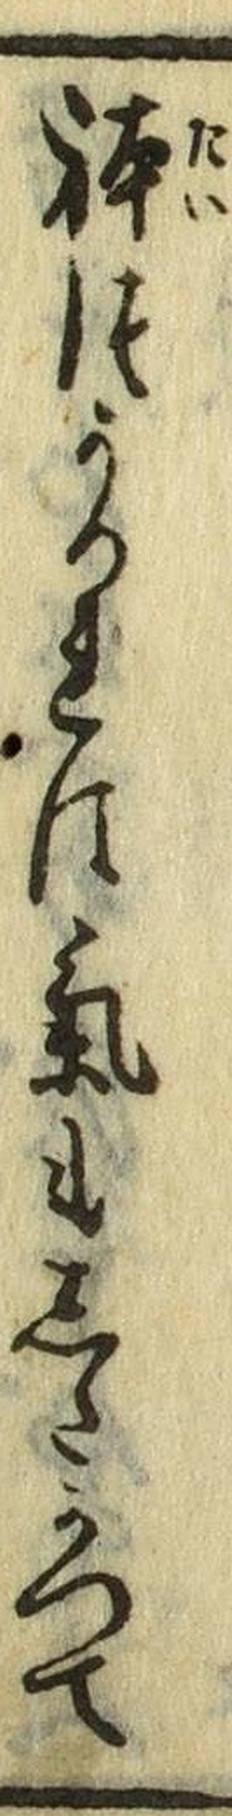体つかるれは気もしたかつて
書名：居家養生記
